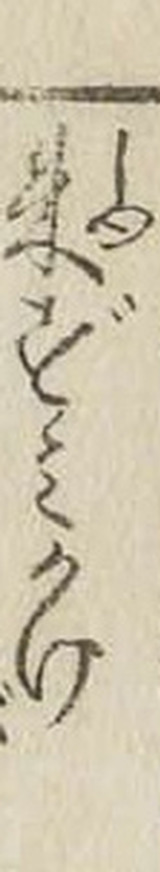朱ずみかけ
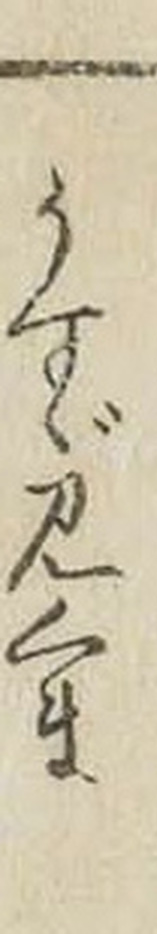うすゞみくま
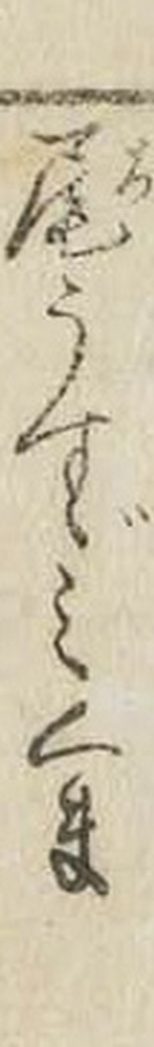尾うすゞみくま
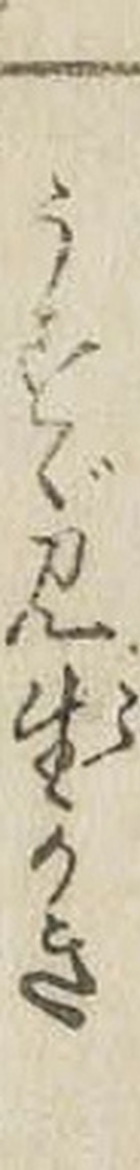うすゞみ生かき

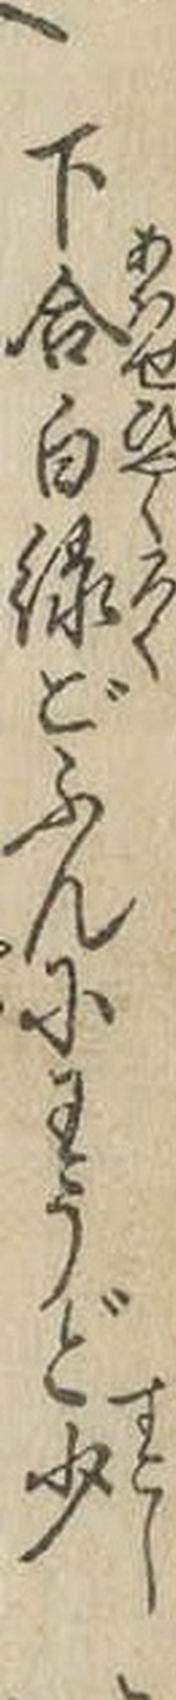粟下合白緑ごふんにわうど少
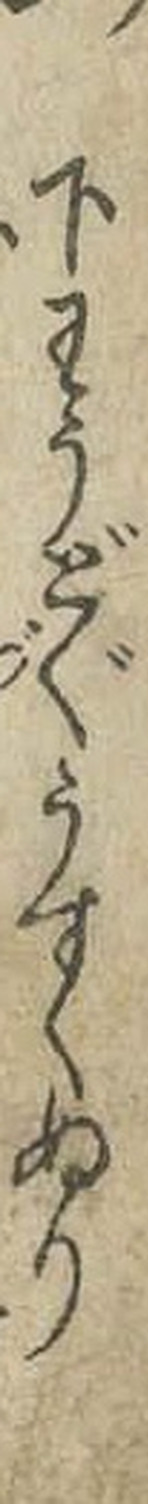鶉下わうどぐうすくぬり
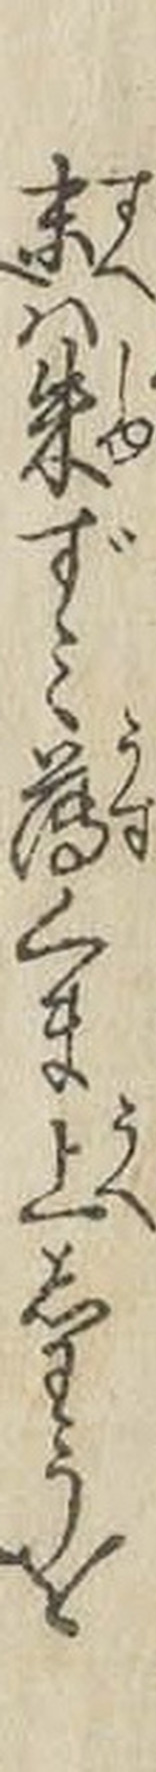末は朱ずみ薄くま上しわうを
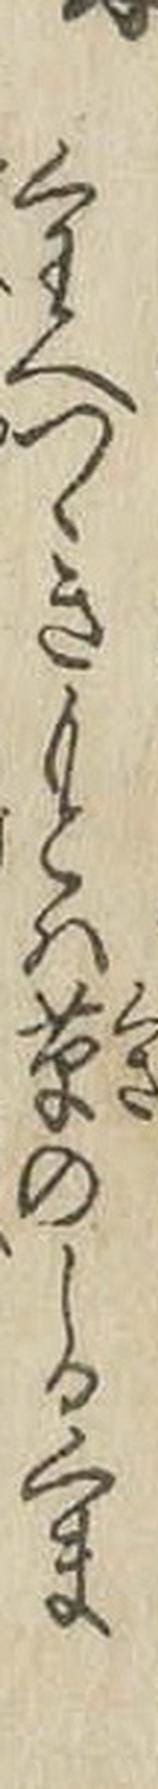くわへつゝきもとは草のしるくま
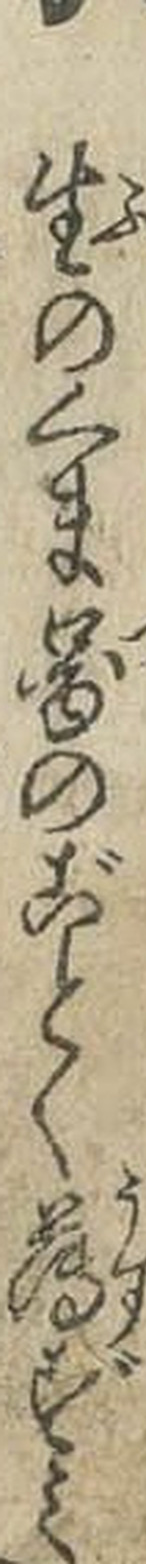生のくま図のごとく薄ずみ
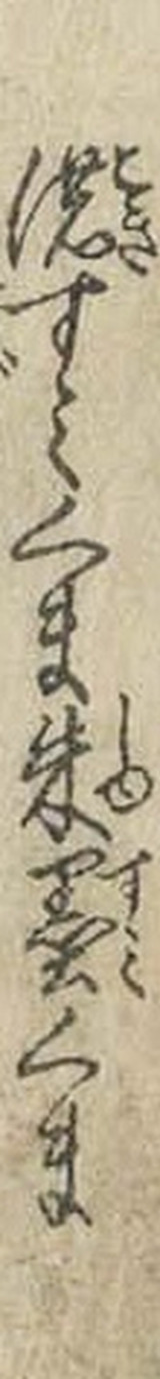濃すみくま朱墨くま
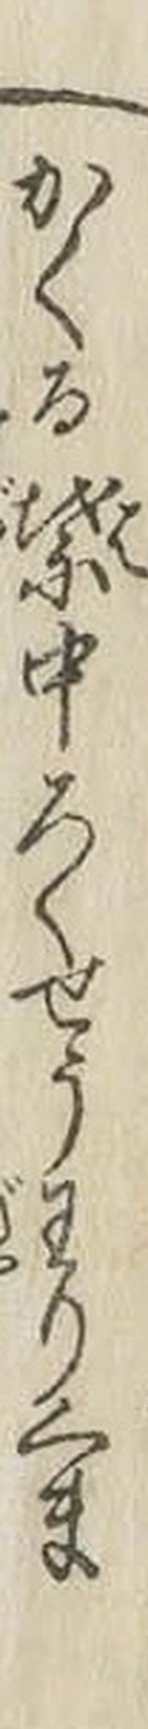かくる葉中ろくせうわりくま
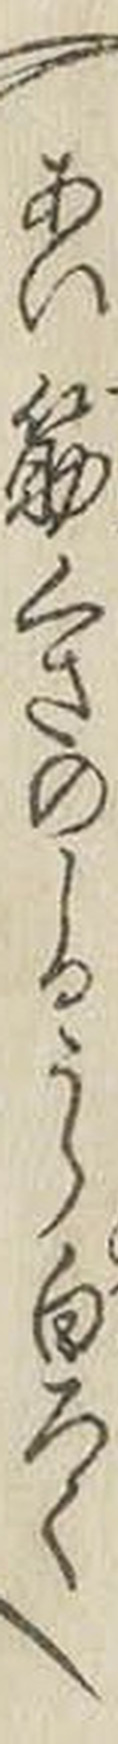あい筋くさのしるうら白ろく
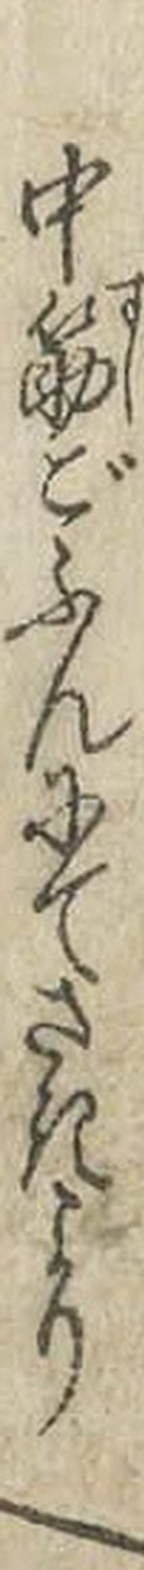中筋ごふんにてさきより
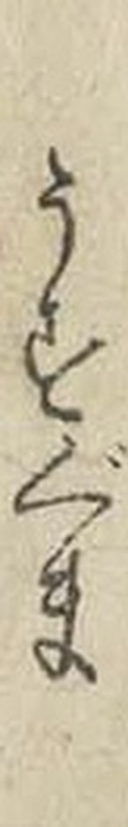うすぐま
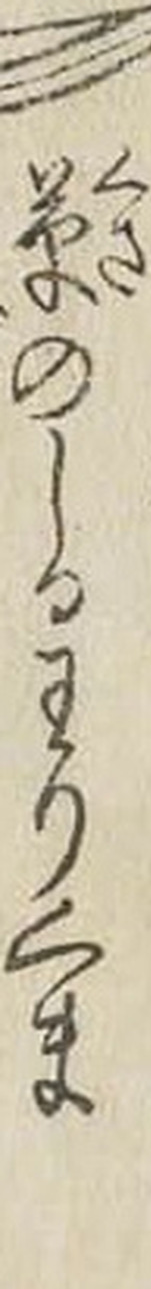草のしるわりくま
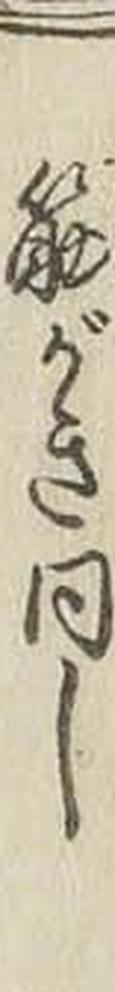筋がき同し
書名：絵本写宝袋 9巻 8之巻
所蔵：東京学芸大学教育コンテンツアーカイブ
